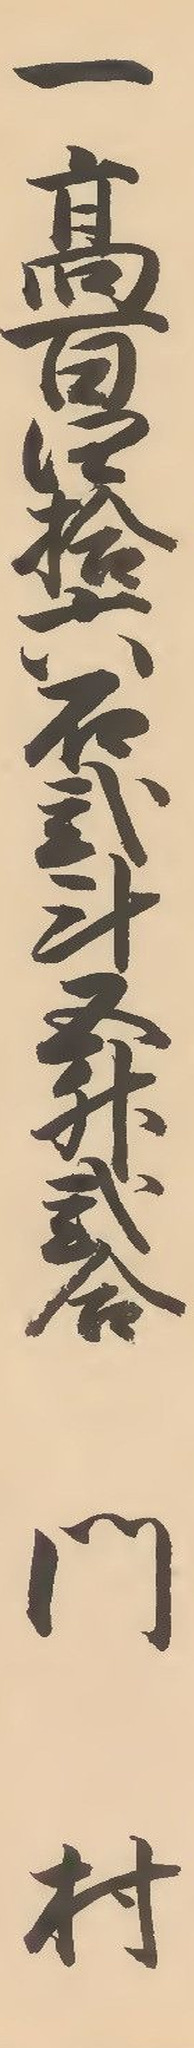一髙百四拾六石弐斗五升弐合門村

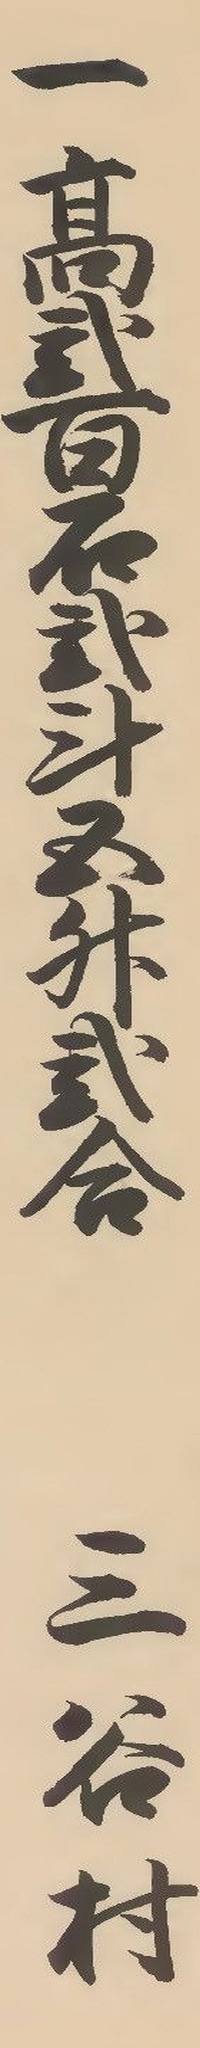一髙弐百石弐斗五升弐合三谷村
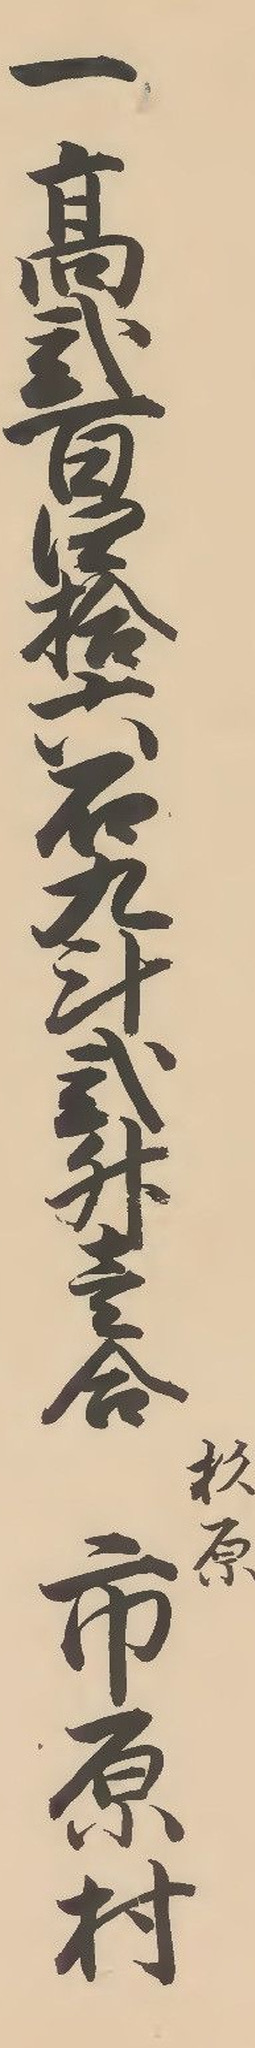一髙弐百四拾六石九斗弐升壱合市原村
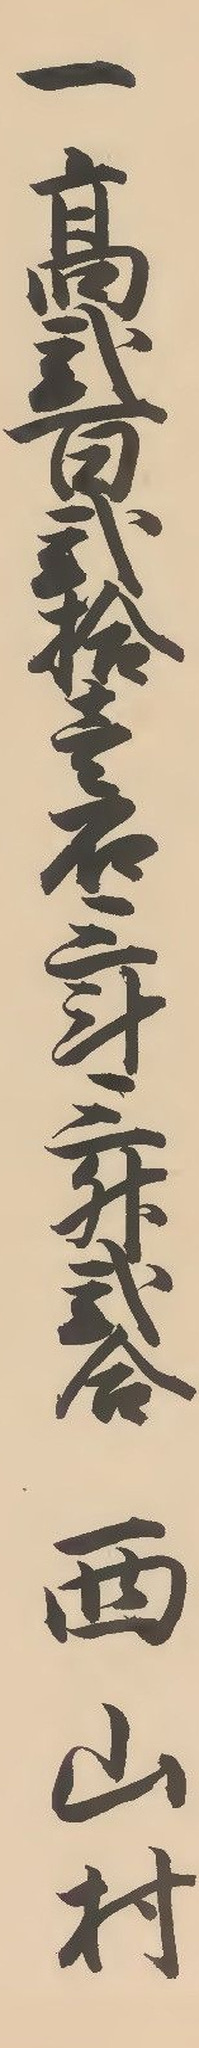一髙弐百弐拾壱石三斗三升弐合西山村
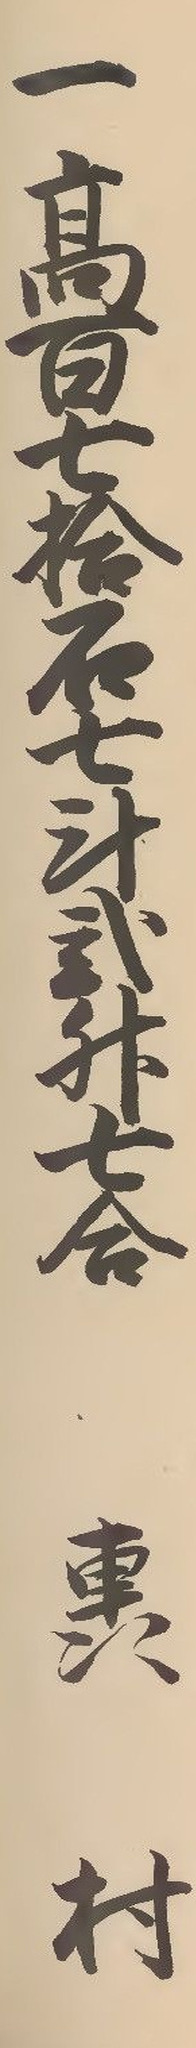一髙百七拾石七斗弐升七合轟村
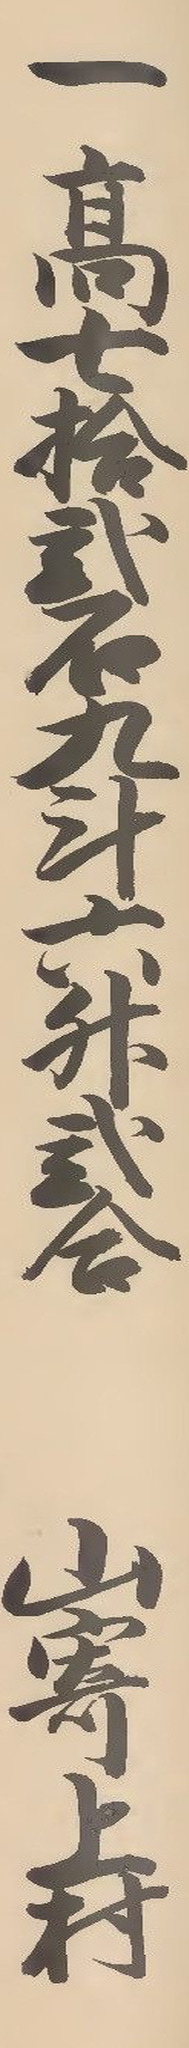一髙七拾弐石九斗六升弐合山寄上村
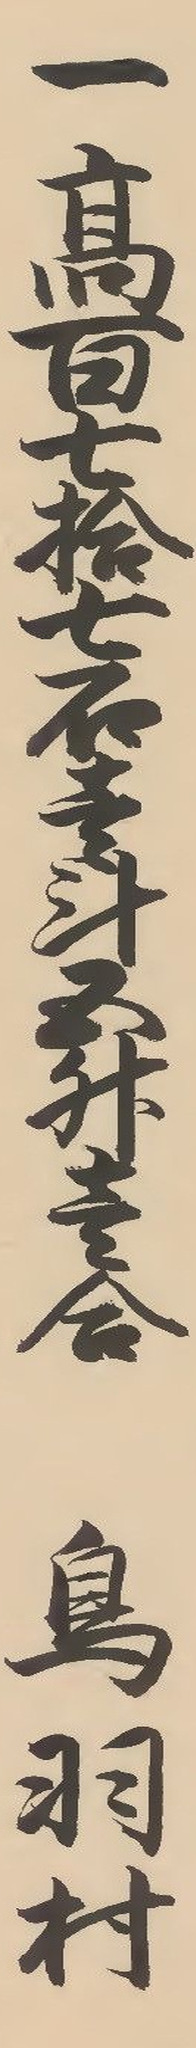一髙百七拾七石壱斗五升壱合鳥羽村
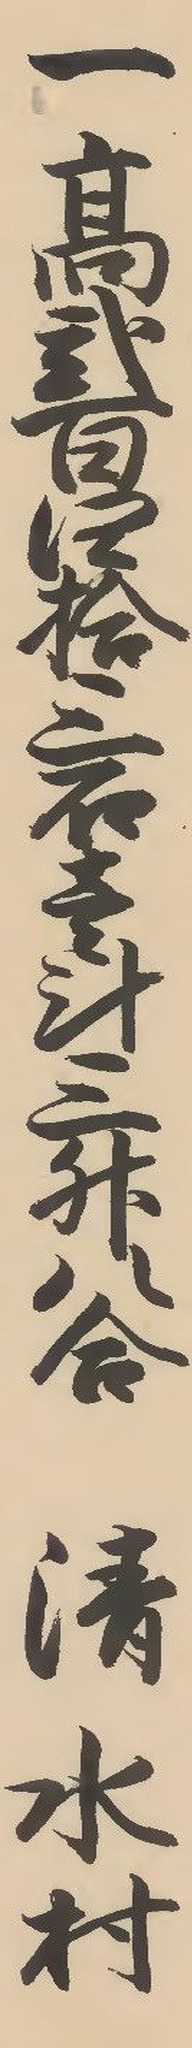一髙弐百四拾三石壱斗三升八合清水村
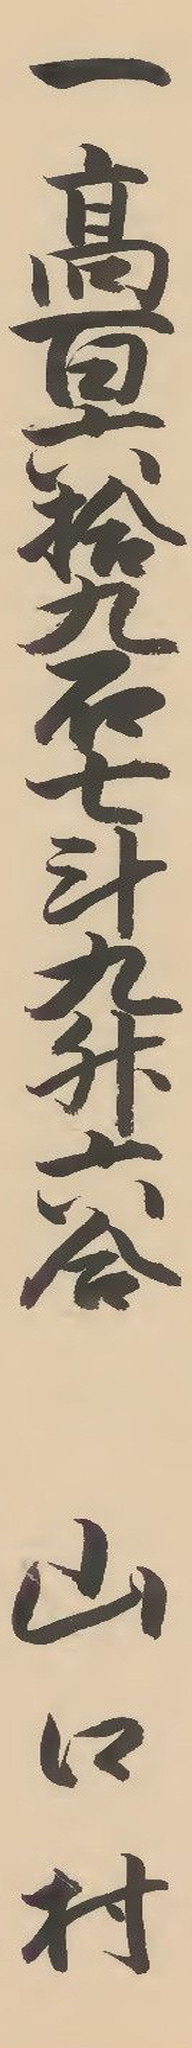一髙百六拾九石七斗九升六合山口村

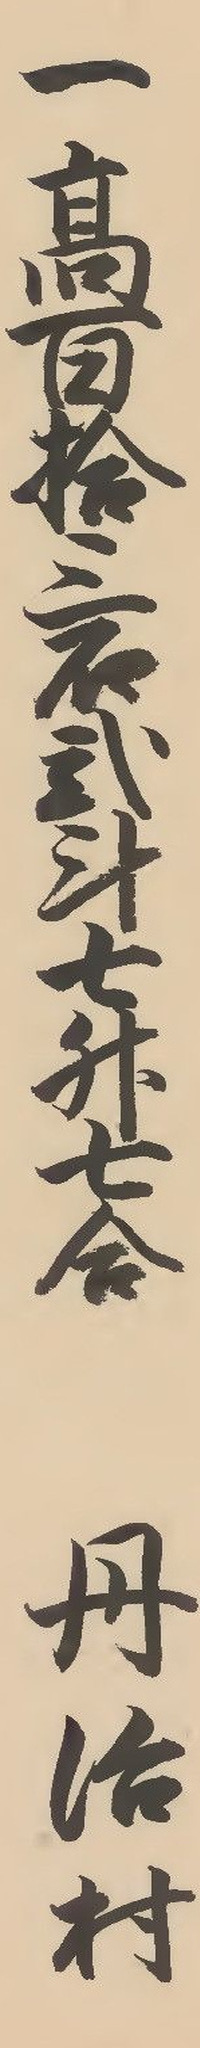一髙百拾三石弐斗七升七合丹治村
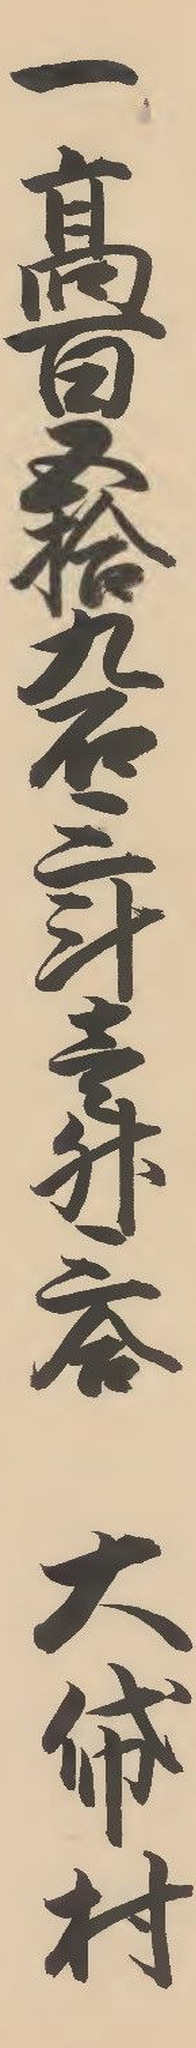一髙五拾九石三斗壱升三合大袋村
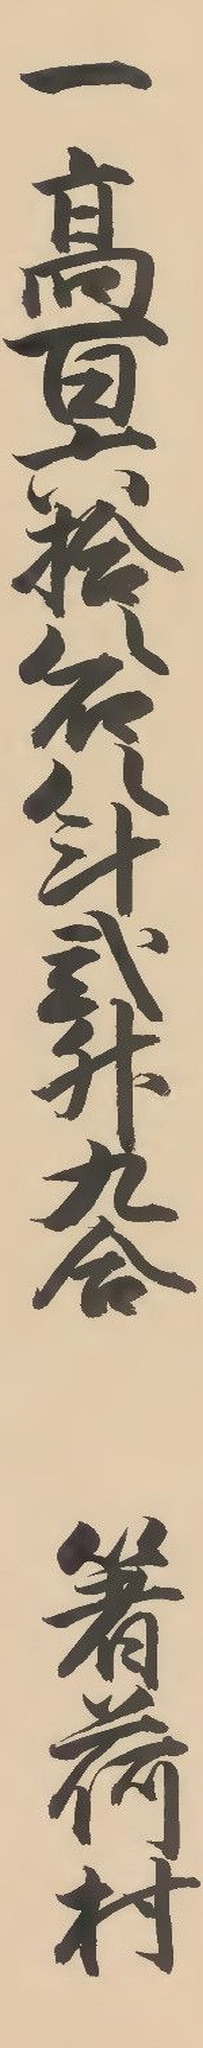一髙百六拾八石八斗壱升九合箸荷村
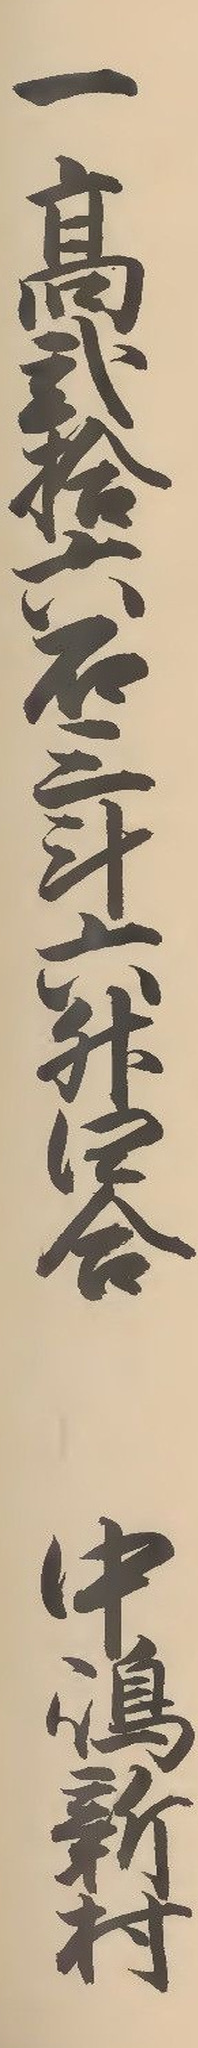一髙弐拾六石三斗六升四合中嶋新村
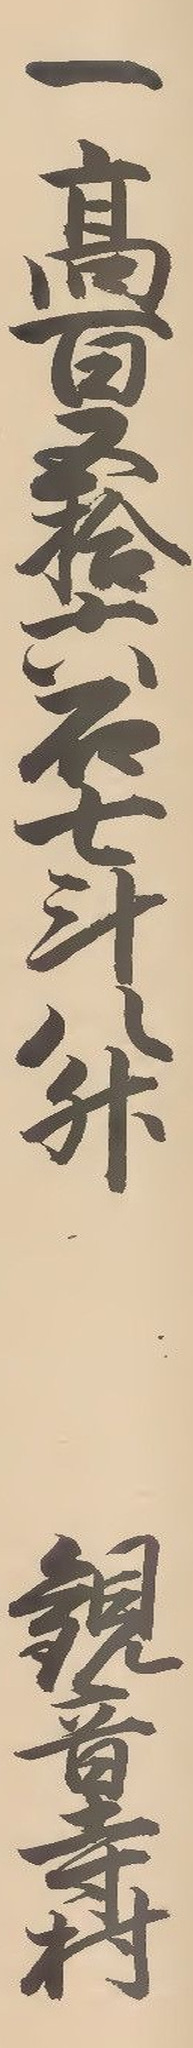一髙百五拾六石七斗八升観音寺村
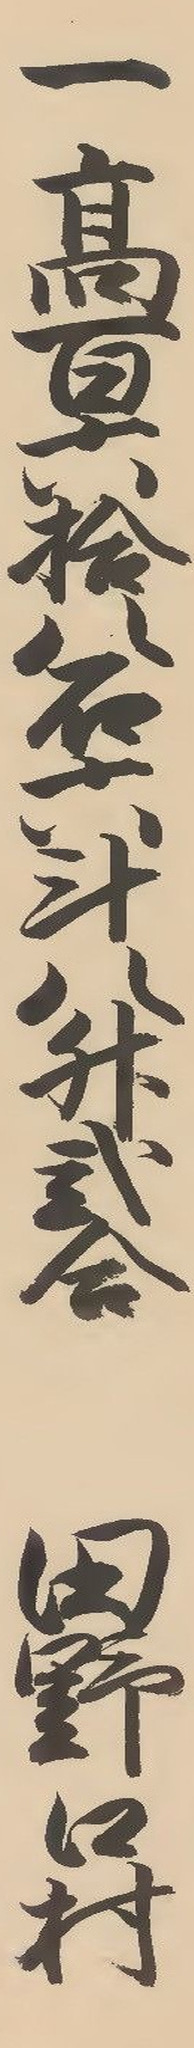一髙百六拾八石六斗八升弐合田野口村
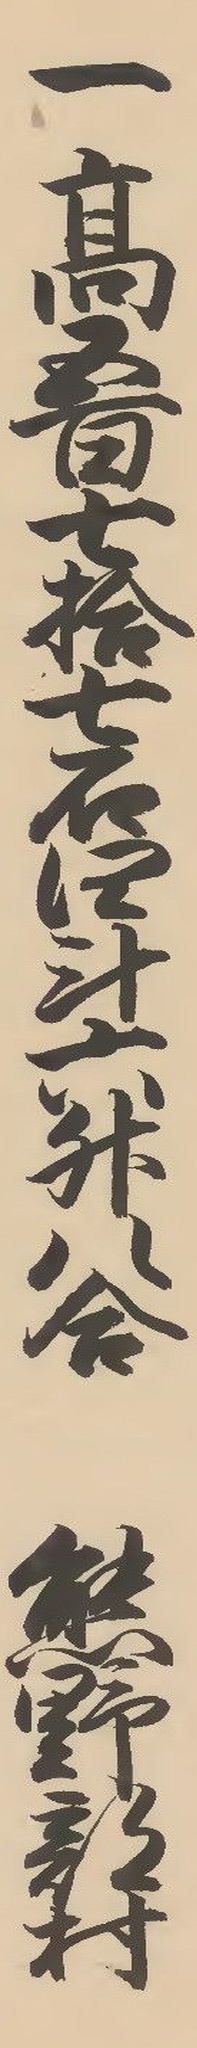一髙五百七拾七石四斗六升八合熊野部村
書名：播磨国郷帳
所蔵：国立公文書館 National Archives of Japan
